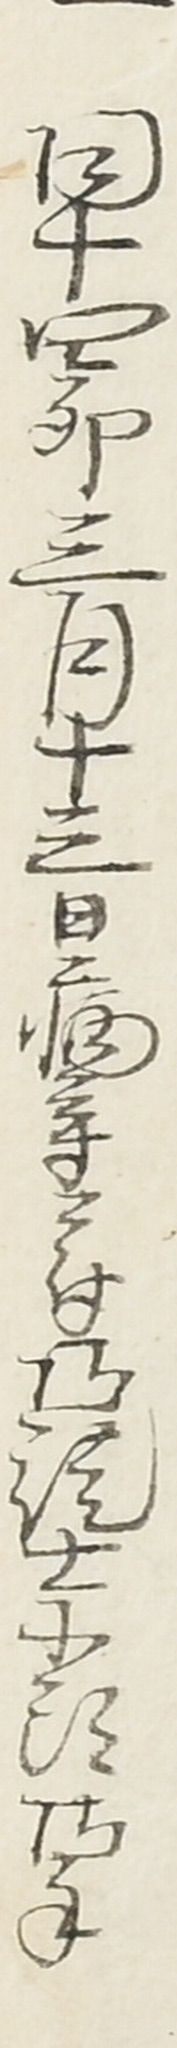一同十四卯三月十三日病気ニ付御徒士小頭御手

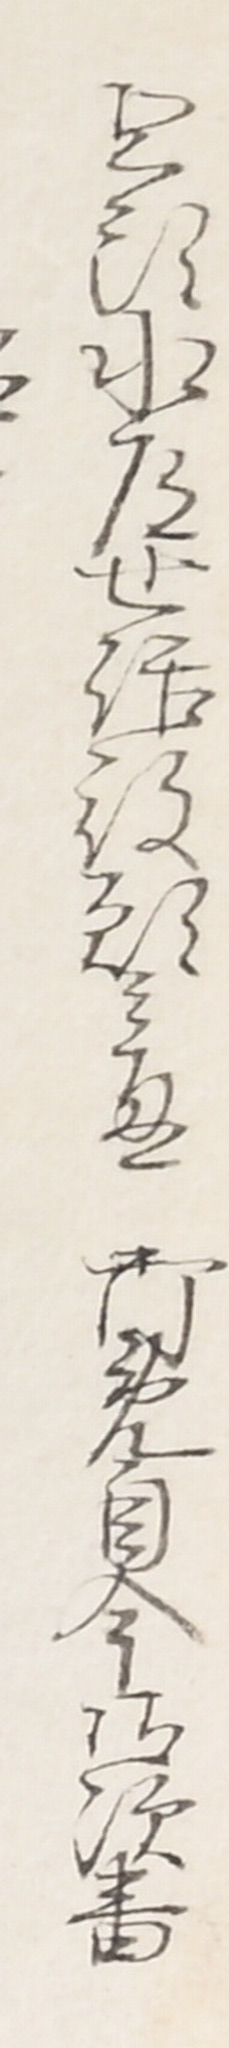廻頭水道世話役願之通御免自今御次番
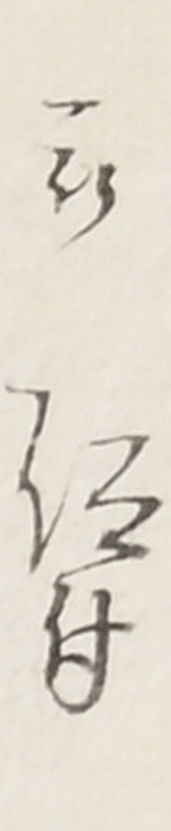被仰付
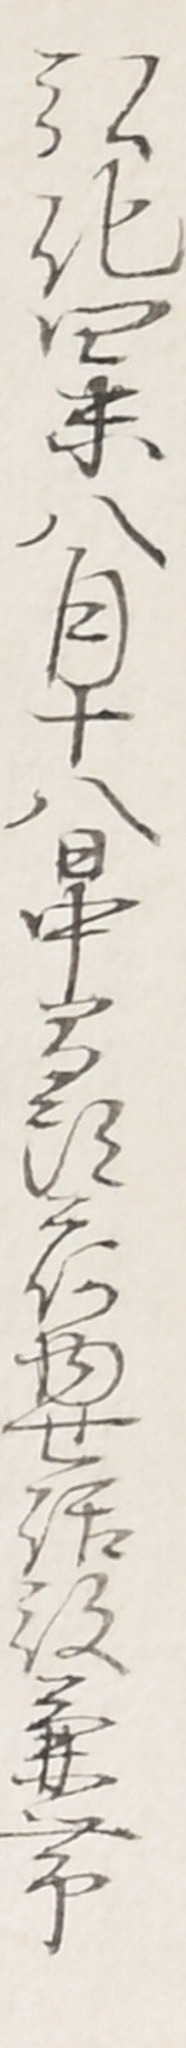一弘化四未八月十八日中間頭荷物世話役兼帯
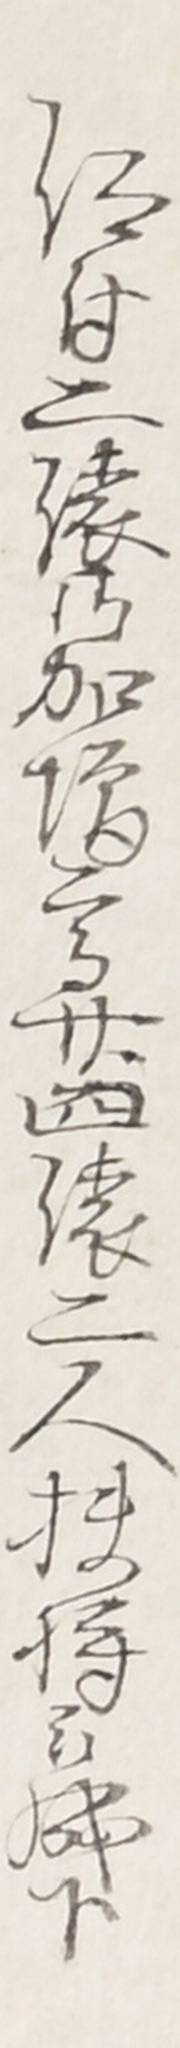被仰付二俵御加増高廿四俵二人扶持被成下
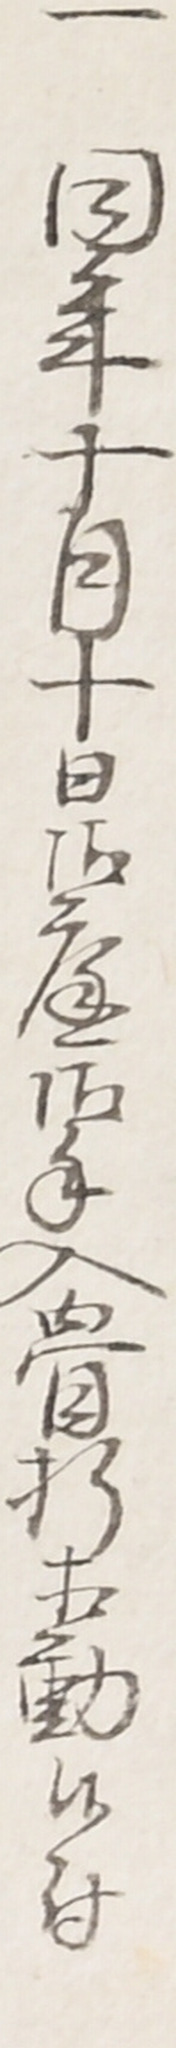一同年十月十日御庭御手入骨折相勤候付
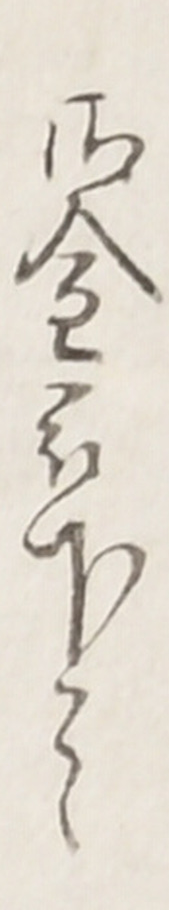御金被下之
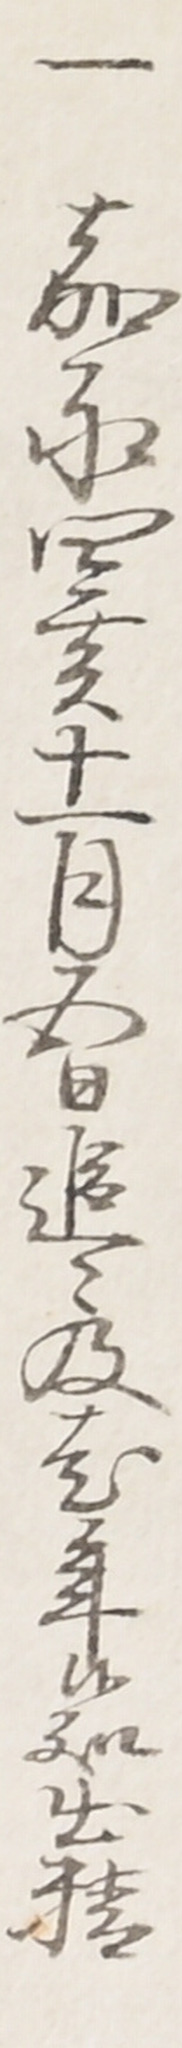一嘉永四亥十一月五日追々及老年候処出精
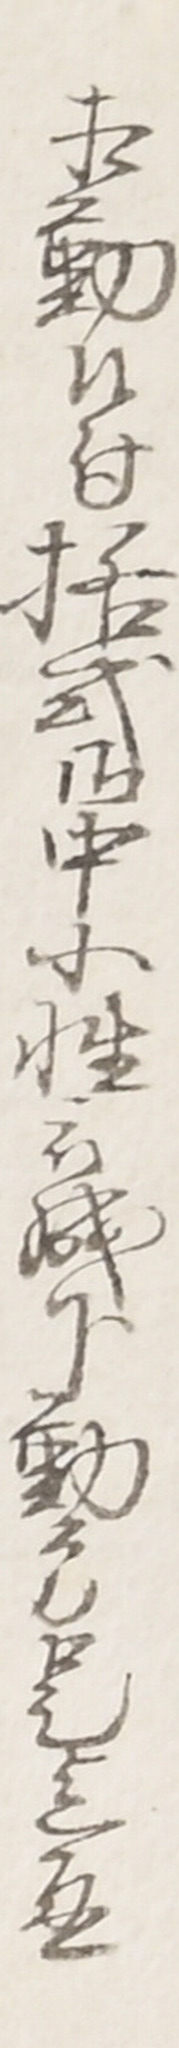相勤候付格式御中小性被成下勤方是迄通
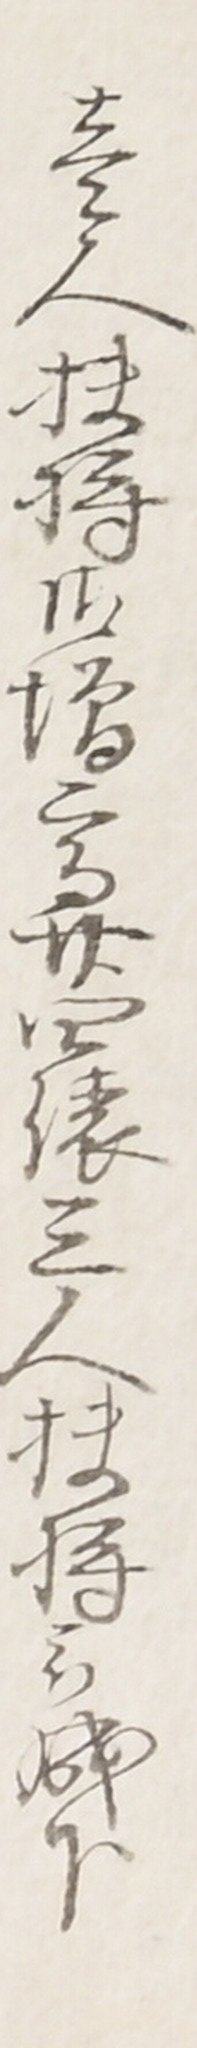壱人扶持御増高廿四俵三人扶持被成下
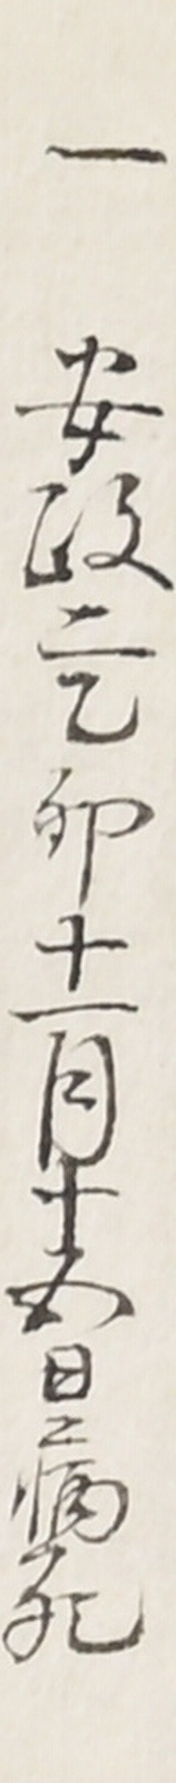一安政二乙卯十一月十五日病死
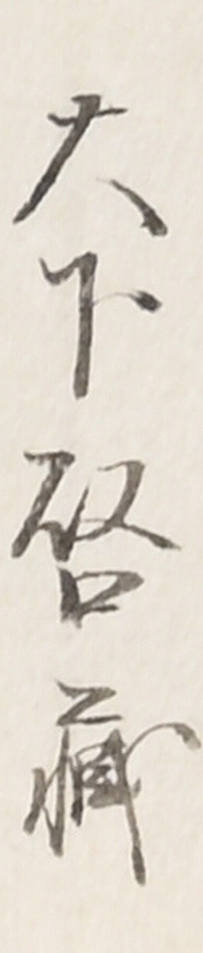大下啓蔵
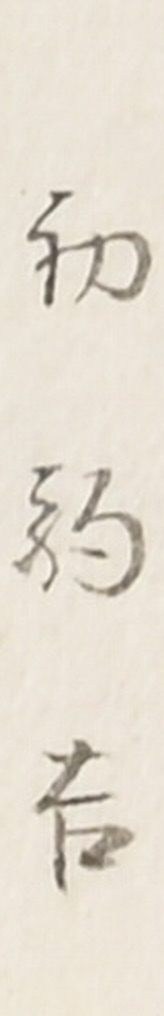初駒吉
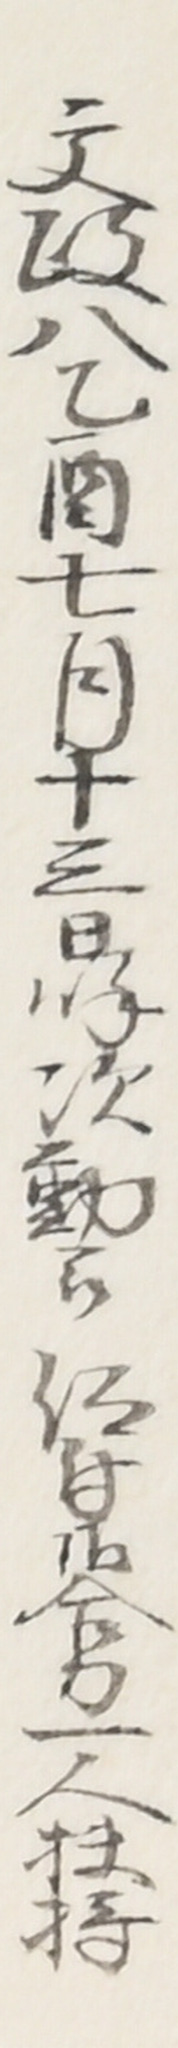一文政八乙酉七月十三日呼次勤被仰付御合力一人扶持
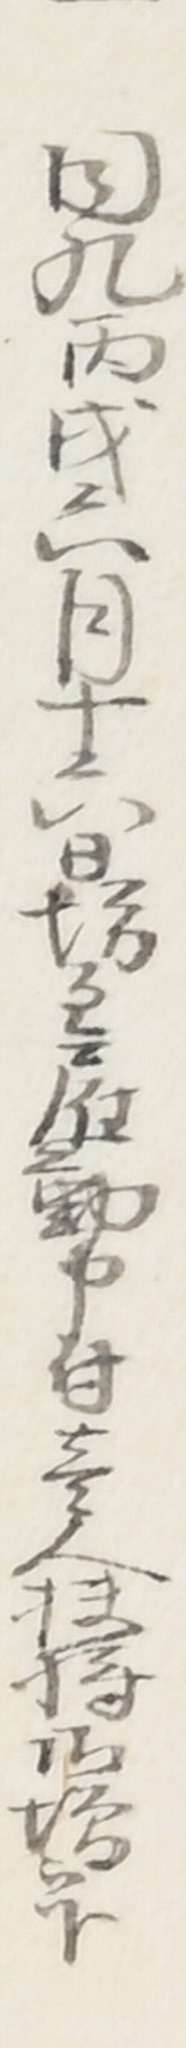一同丙戌六月十六日坊主雇勤申付壱人扶持御増被下
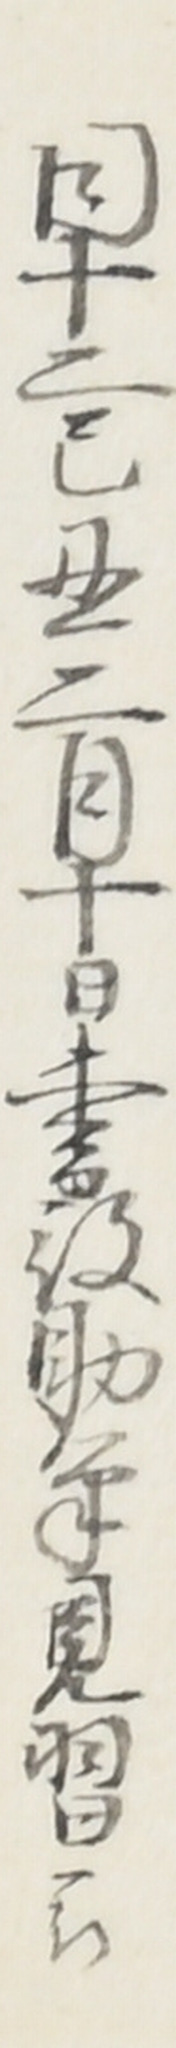一同十二己丑二月十日書役助筆見習被
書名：無足諸士勤仕録（四）
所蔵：伊那市立高遠町図書館・合同会社AMANE
